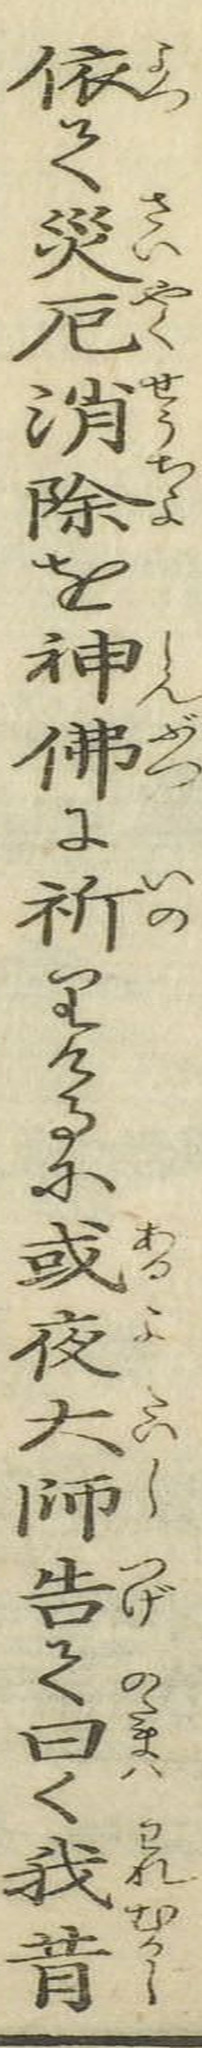依て災厄消除を神佛に祈りけるに或夜大師告て曰く我昔
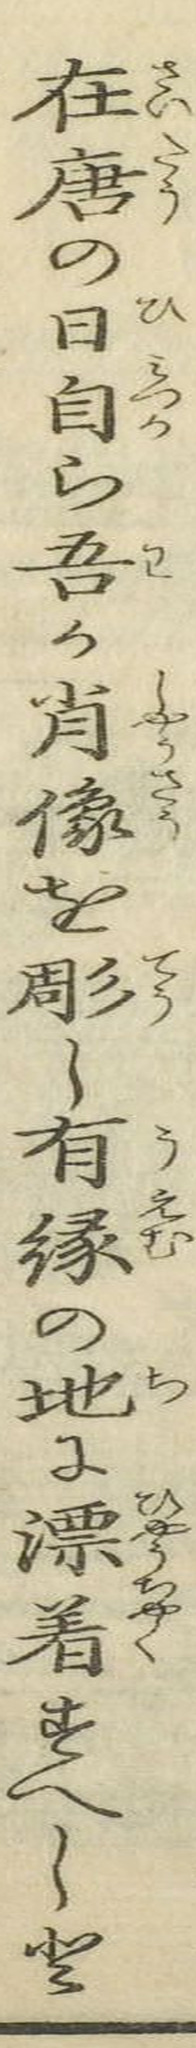在唐の日自ら吾か肖像を彫し有縁の地に漂着すへしと
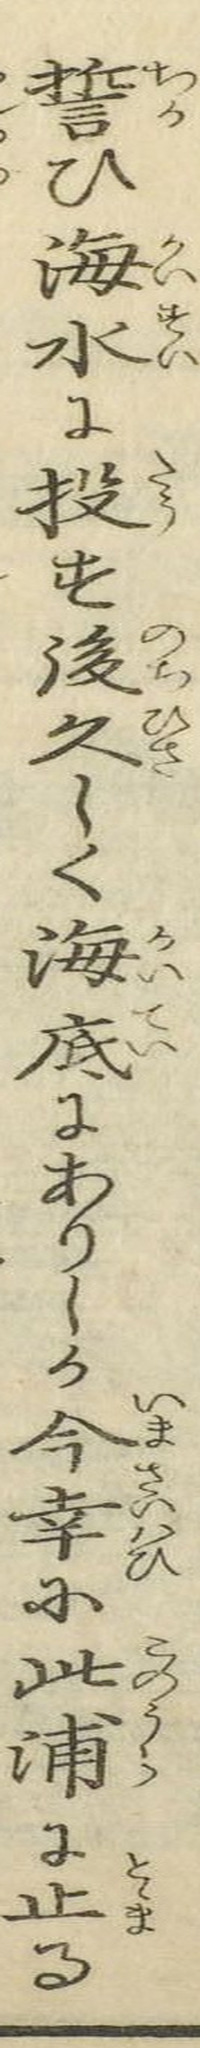誓ひ海水に投す後久しく海底にありしか今幸に此浦に止る
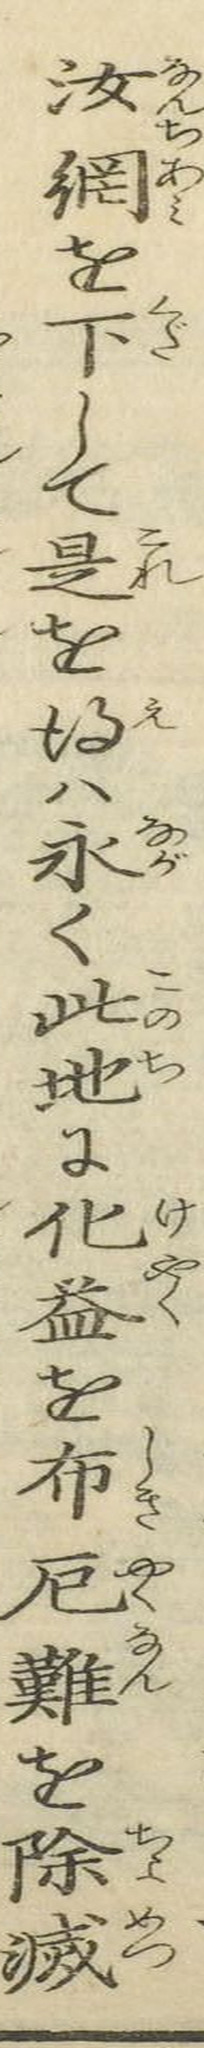汝網を下して是を得は永く此地に化益を布厄難を除滅
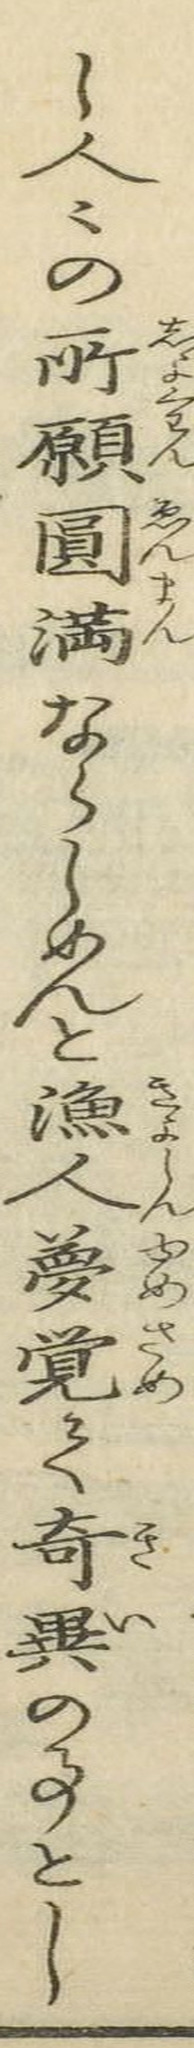し人々の所願圓満ならしめんと漁人夢覚て奇異の事とし
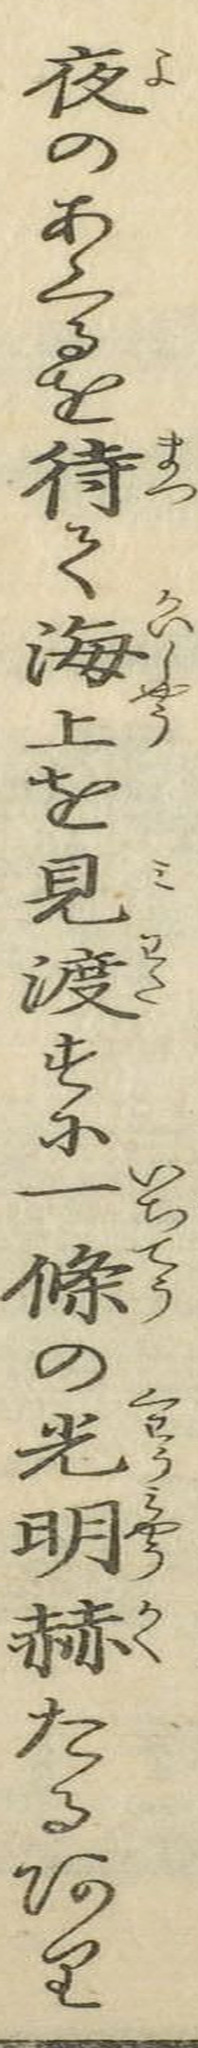夜のあくるを待て海上を見渡すに一條の光明赫たるあり
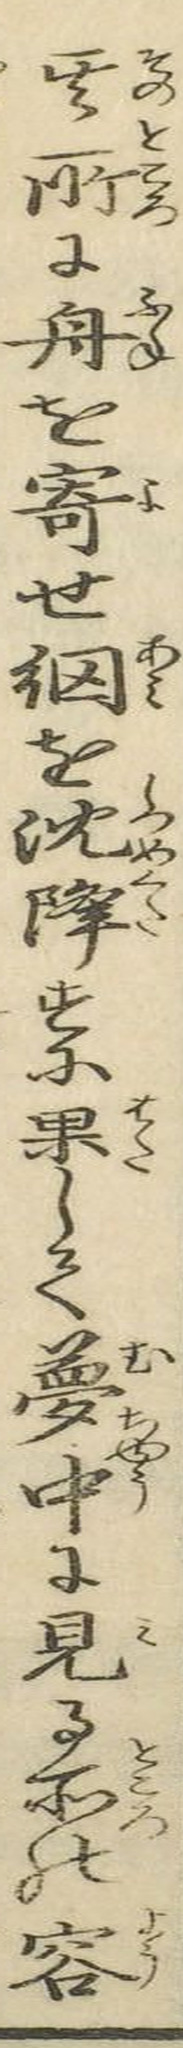其所に舟を寄せ網を沈降すに果して夢中に見る所の容
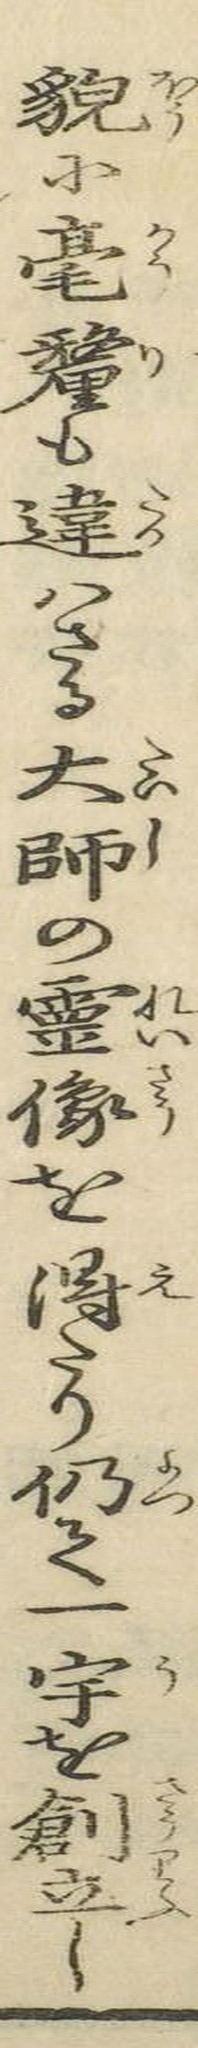貌に毫釐も違はさる大師の霊像を得たり仍て一宇を創立し
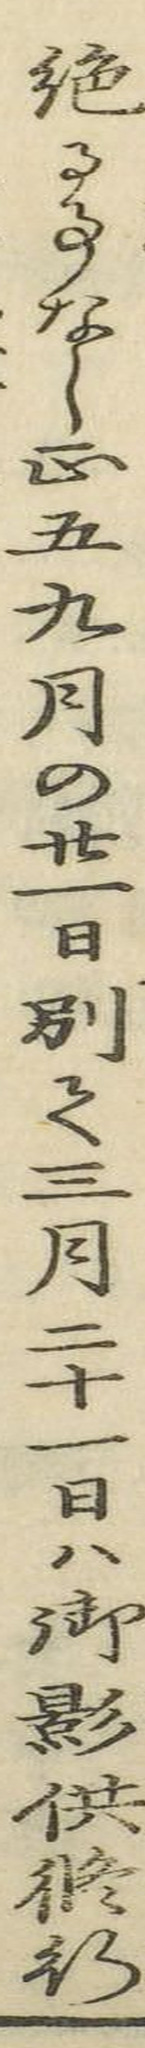絶る事なし正五九月の廿一日別て三月二十一日は御影供修行
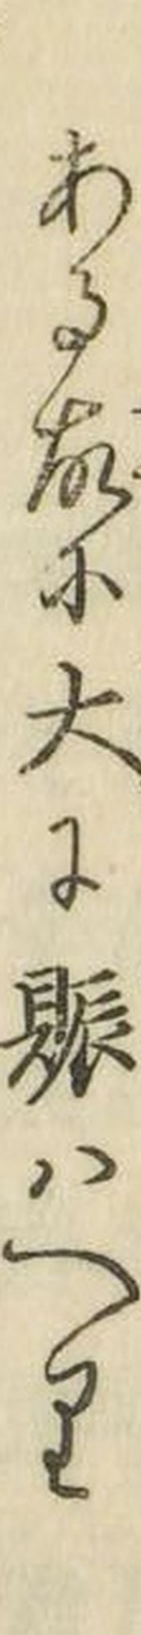ある故に大に賑はへり
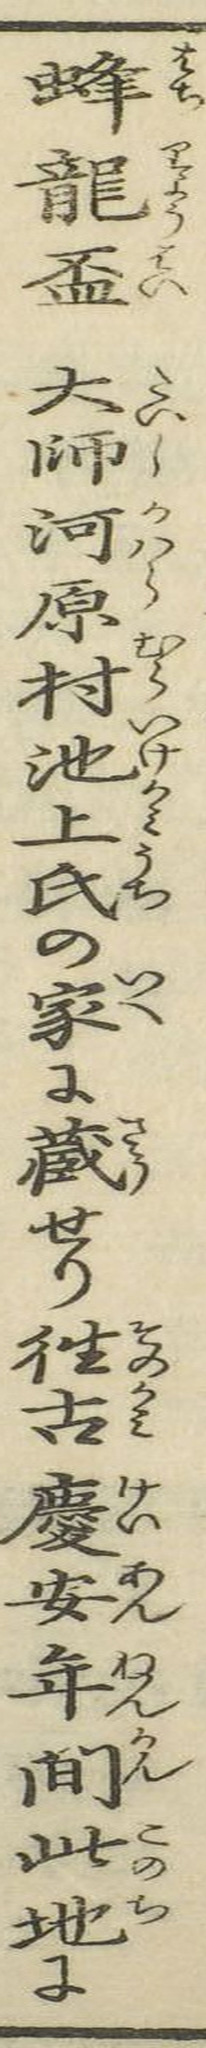蜂龍盃大師河原村池上氏の家に蔵せり往古慶安年間此地に
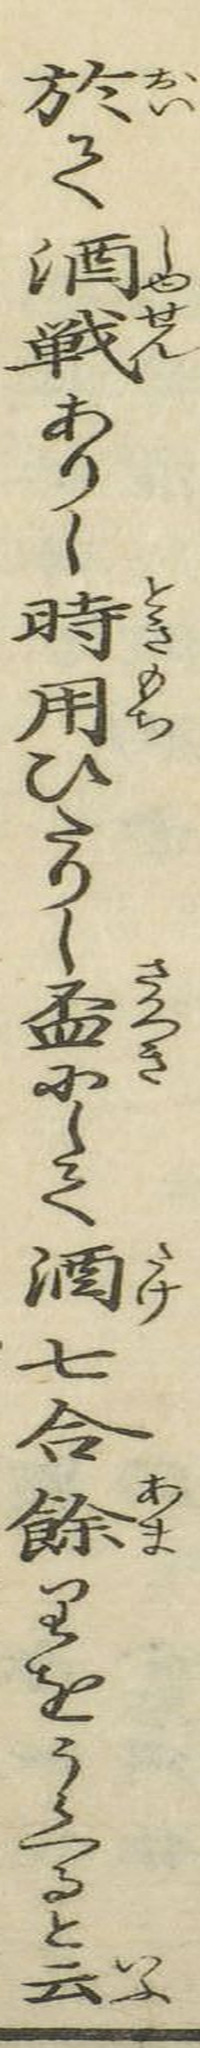於て酒戦ありし時用ひたりし盃にして酒七合餘りをうらへると云
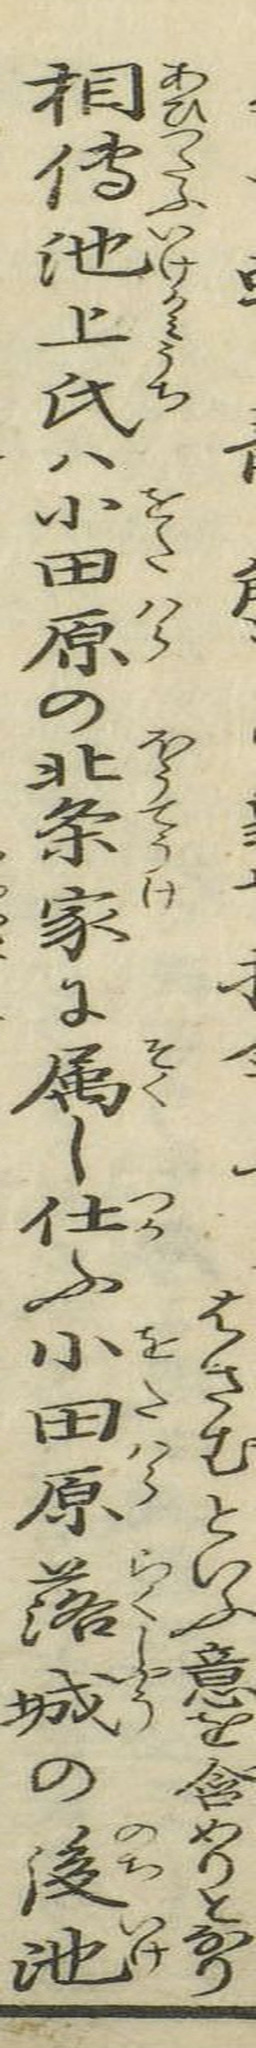相傳池上氏は小田原の北条家に属し仕ふ小田原落城の後池
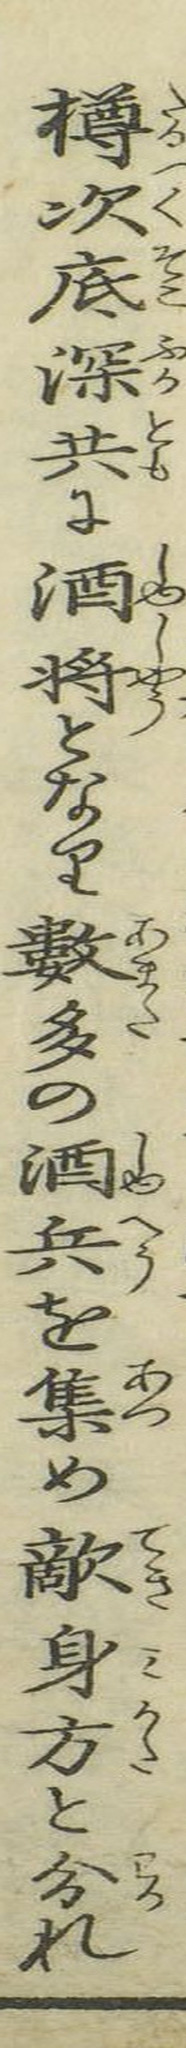樽次底深共に酒将となり數多の酒兵を集め敵身方と分れ

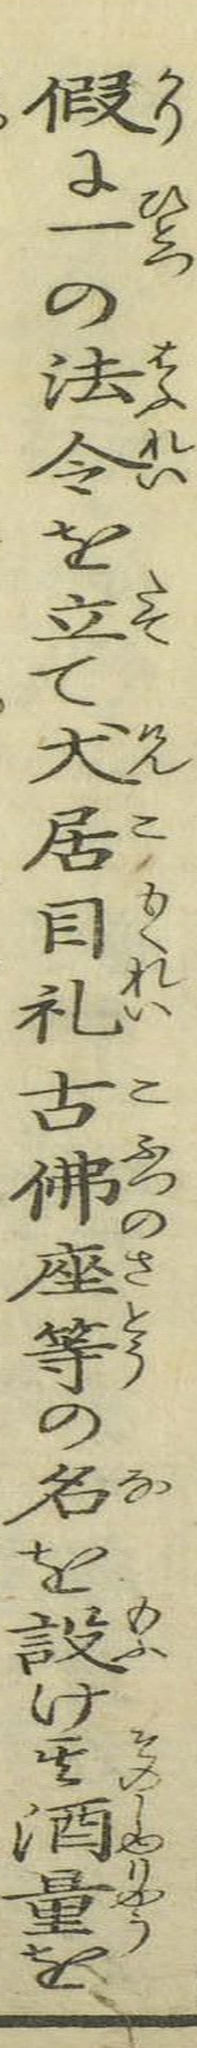假に一の法令を立て犬居目礼古佛座等の名を設け其酒量を
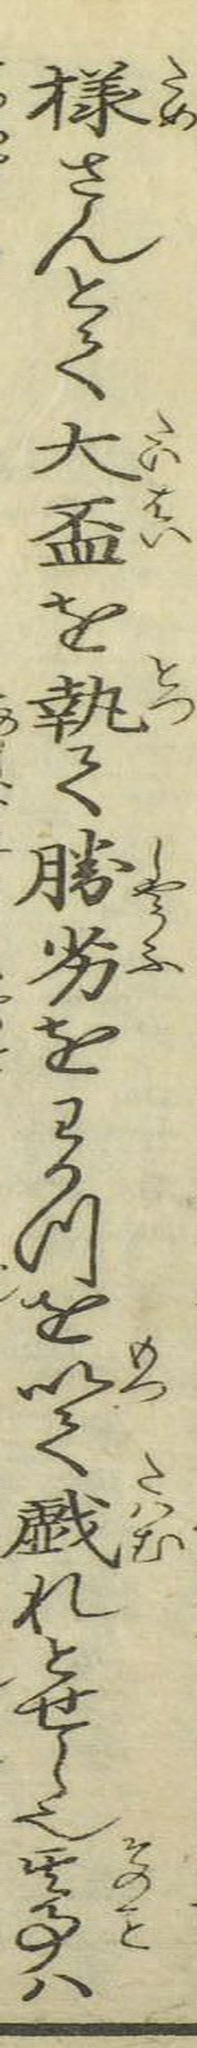様さんとて大盃を執て勝劣をわかつを以て戯れとせし也其事は
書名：江戸名所図会 20巻 巻之5
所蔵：東京学芸大学教育コンテンツアーカイブ
